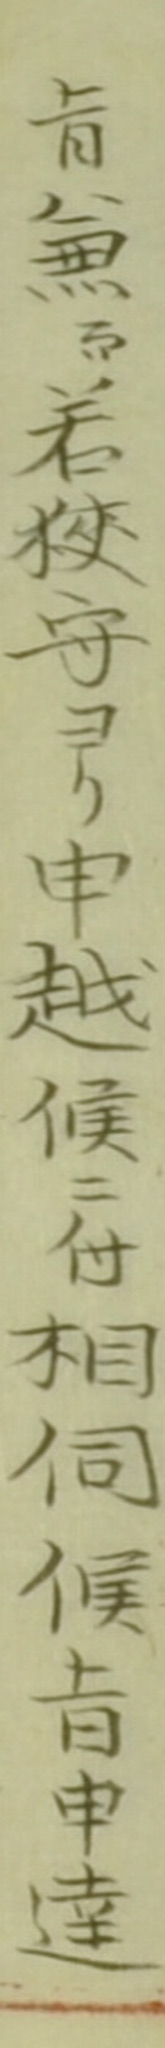旨兼而若狭守ヨリ申越候ニ付相伺候旨申達
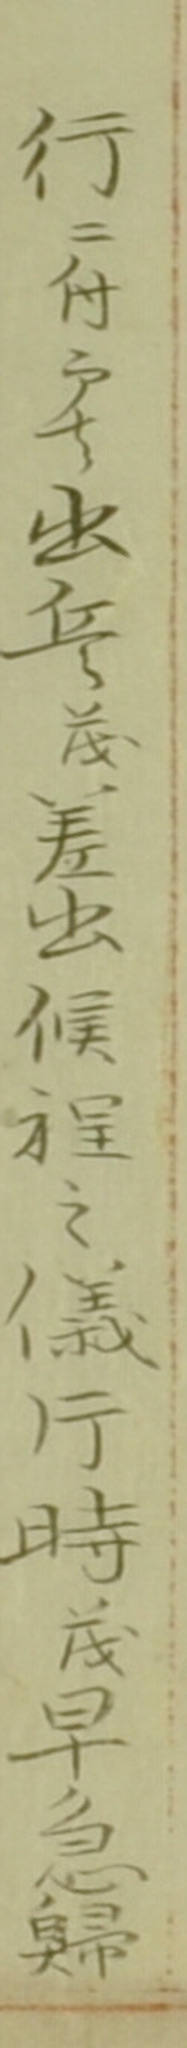行ニ付テハ出兵茂差出候程之儀片時茂早急帰
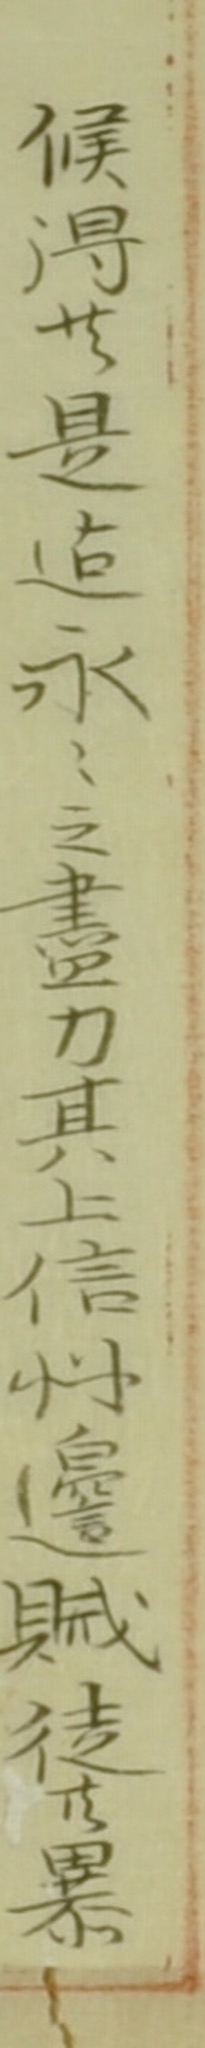候得共是迄永々之尽力其上信州辺賊徒共暴
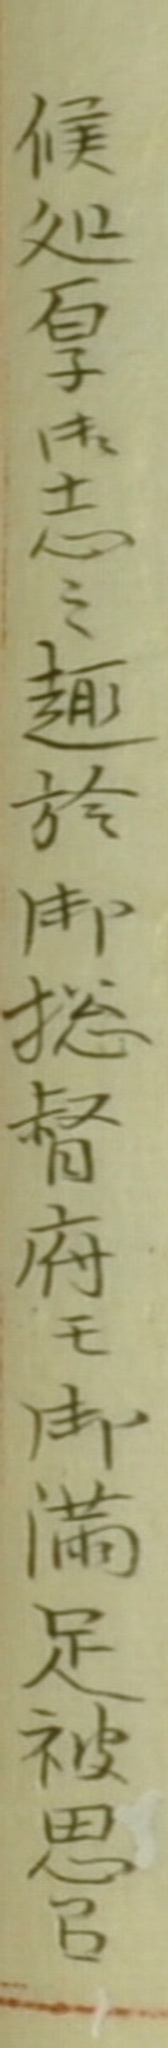候処厚御志之趣於御摠督府モ御満足被思召
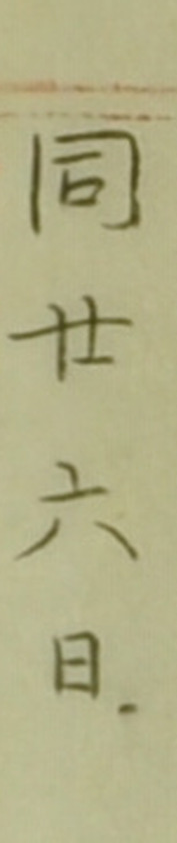同廿六日
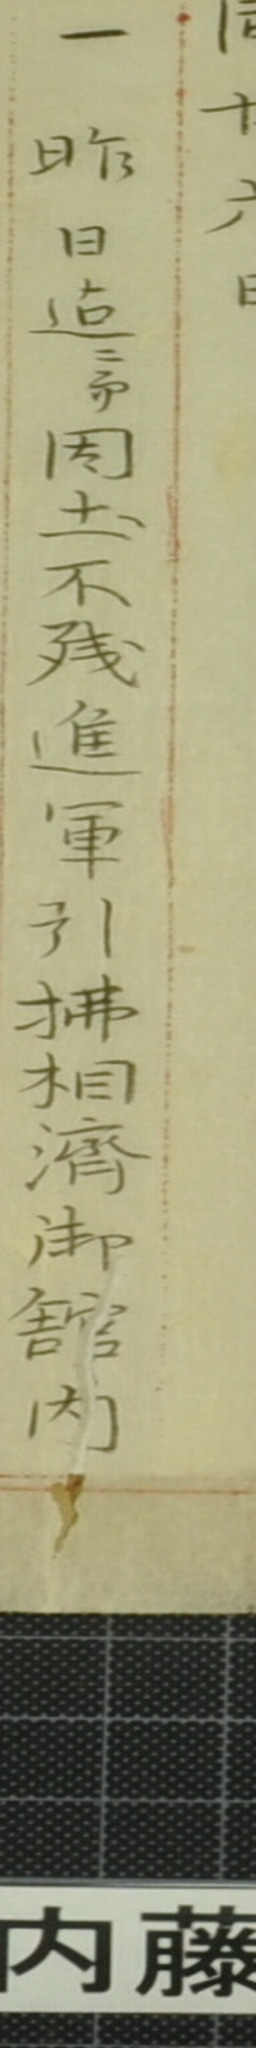一昨日迄ニ而因土不残進軍引払相済御館内
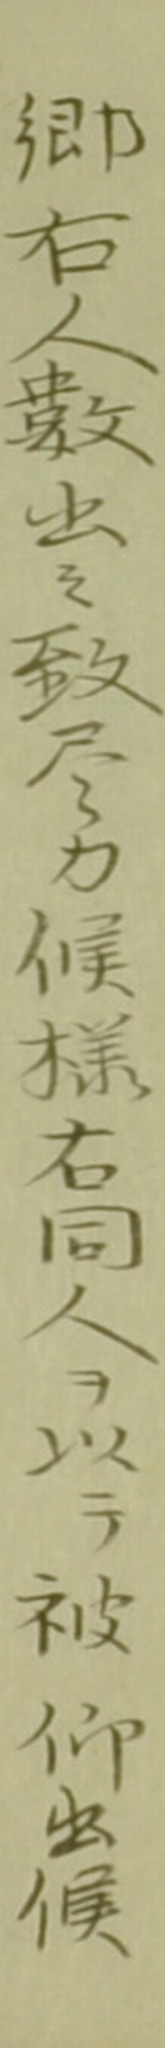郷右人数出之致尽力候様右同人ヲ以テ被仰出候
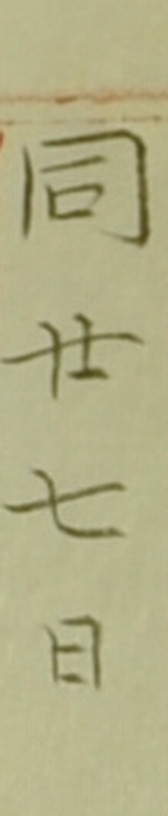同廿七日

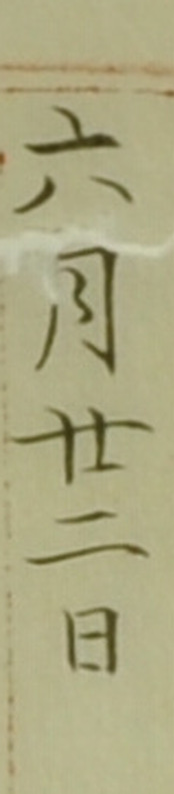六月廿二日
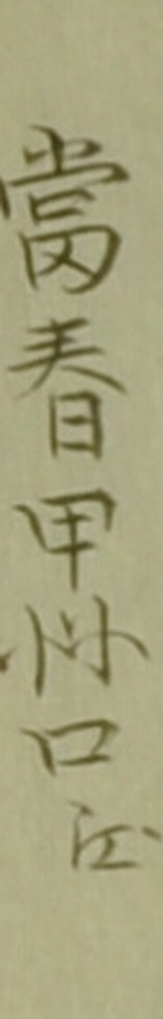当春甲州口江
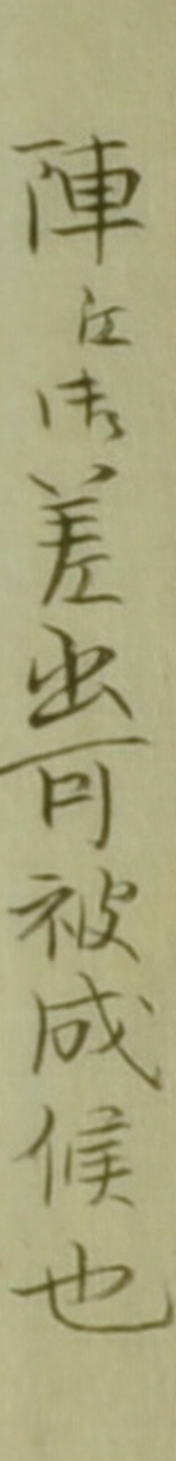陣江御差出可被成候也
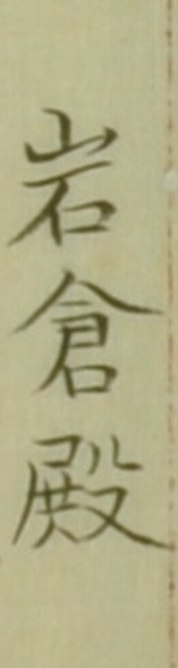岩倉殿
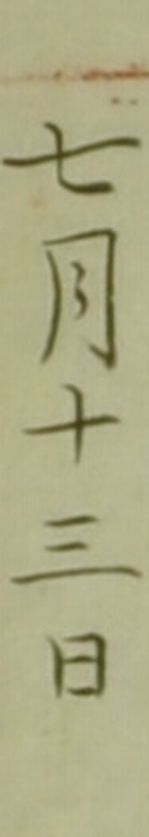七月十三日
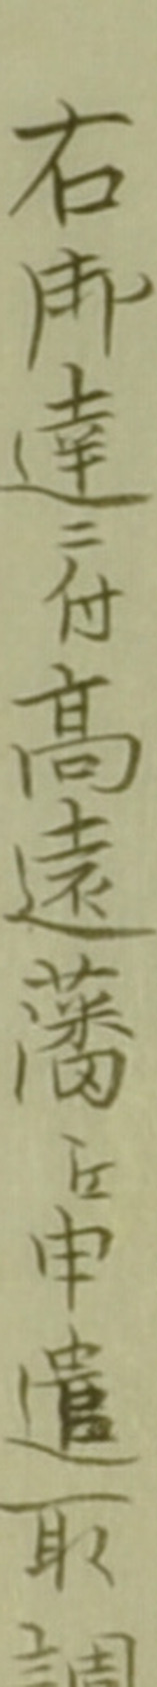右御達ニ付高遠藩江申遣取調
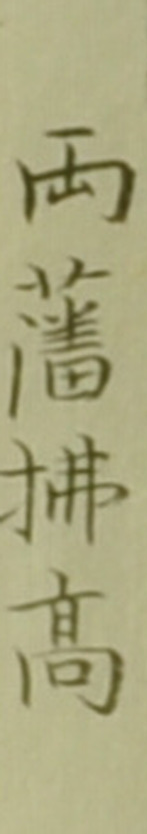両藩払高

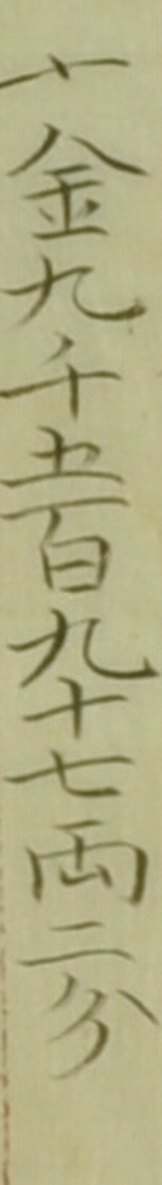〆金九千五百九十七両二分
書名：御東征ニ付甲州口兵食人馬御賄之事件（控）
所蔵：伊那市立高遠町図書館・合同会社AMANE
